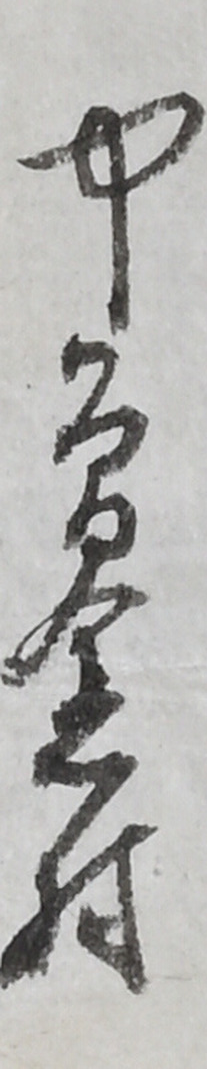中曽倉村
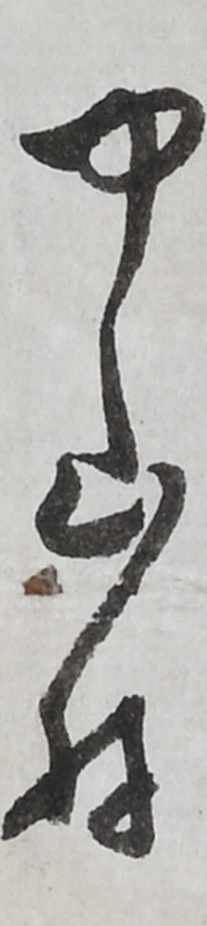中山村
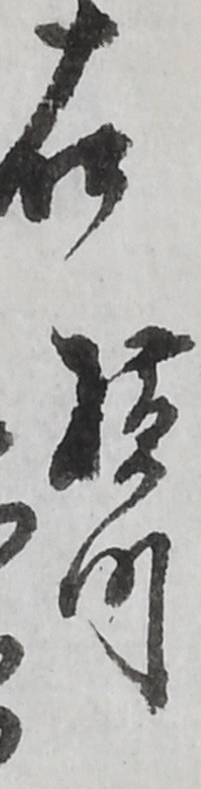右横町
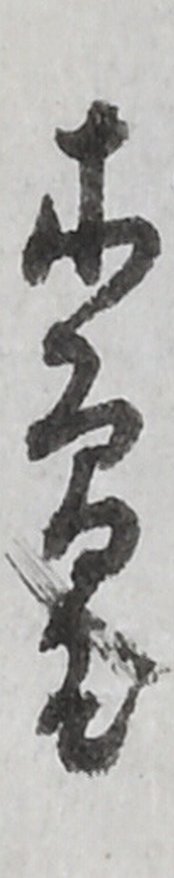木曽屋
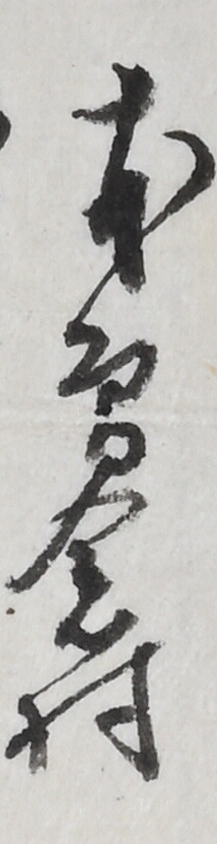本曽倉村
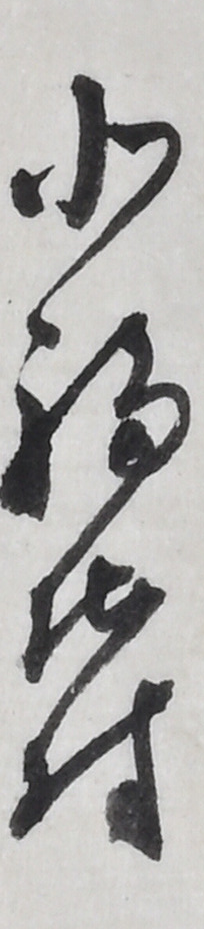北福地村
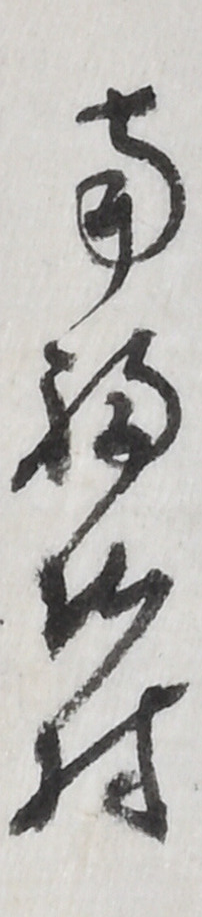南福地村
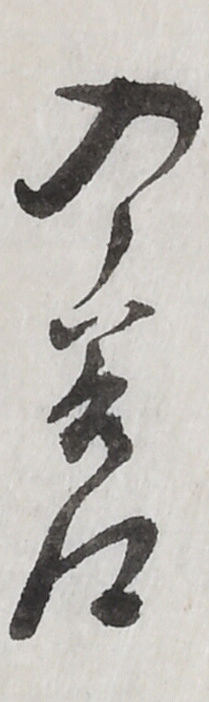入ノ谷郷
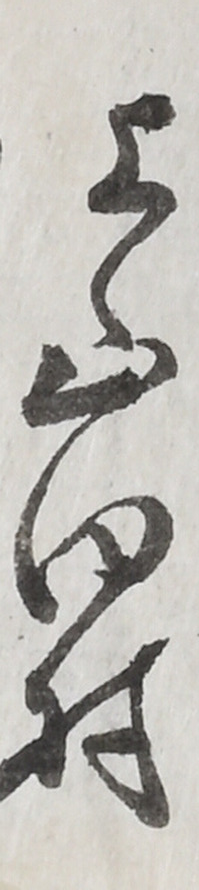上山田村
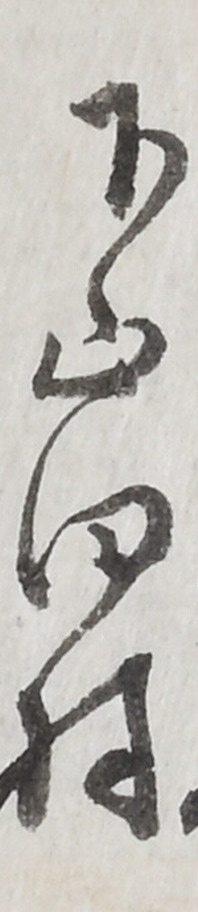下山田村
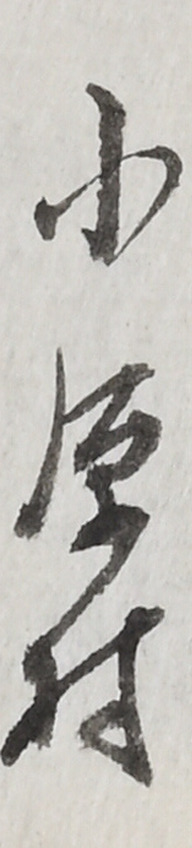小原村
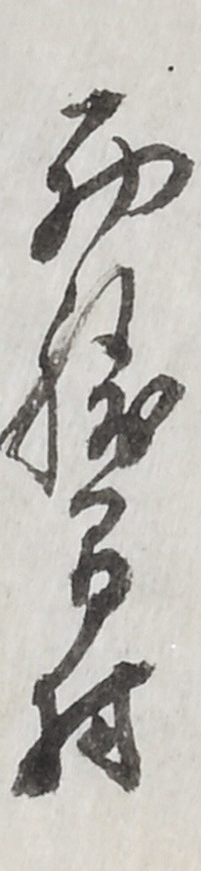西勝間村
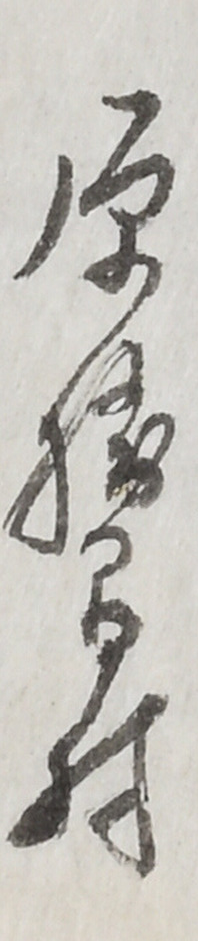西勝間村
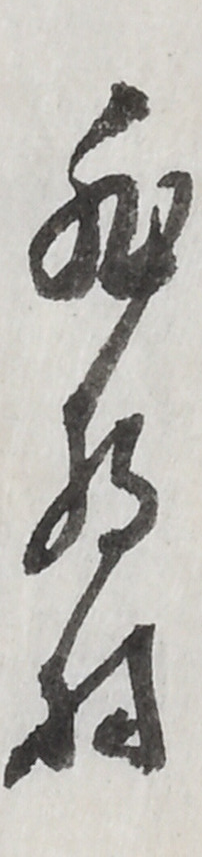非持村
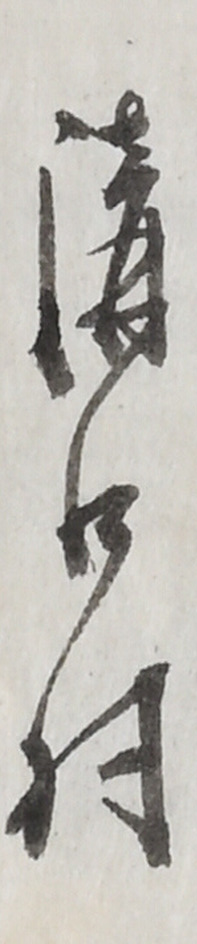溝口村

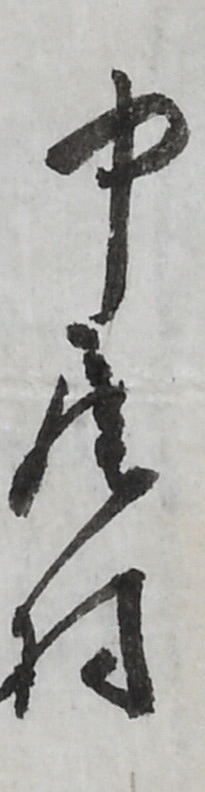中尾村
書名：年内行事帳
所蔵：伊那市立高遠町図書館・合同会社AMANE
